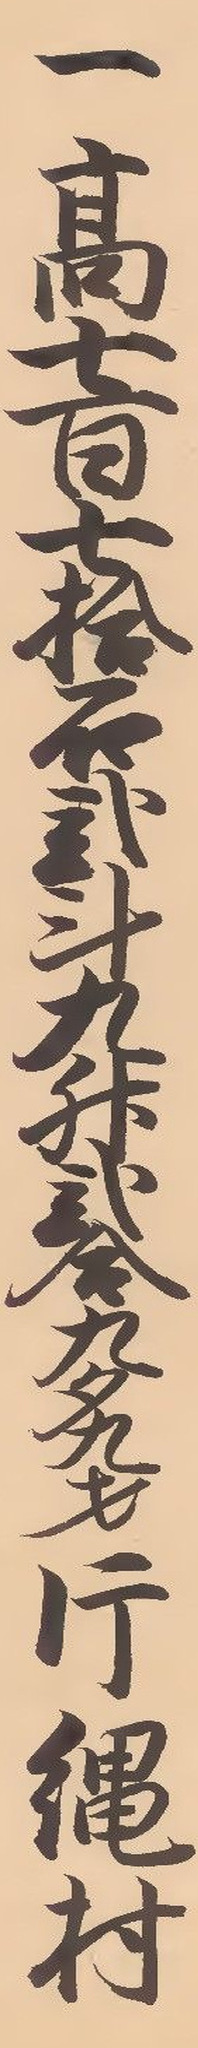一高七百七拾石弐斗九升弐合九勺九才片縄村
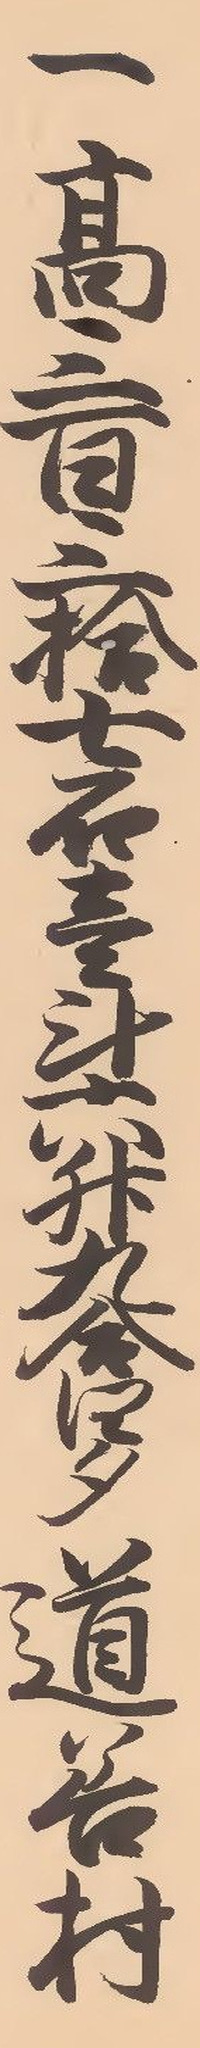一高三百三拾七石壱斗六升九合四勺道善村
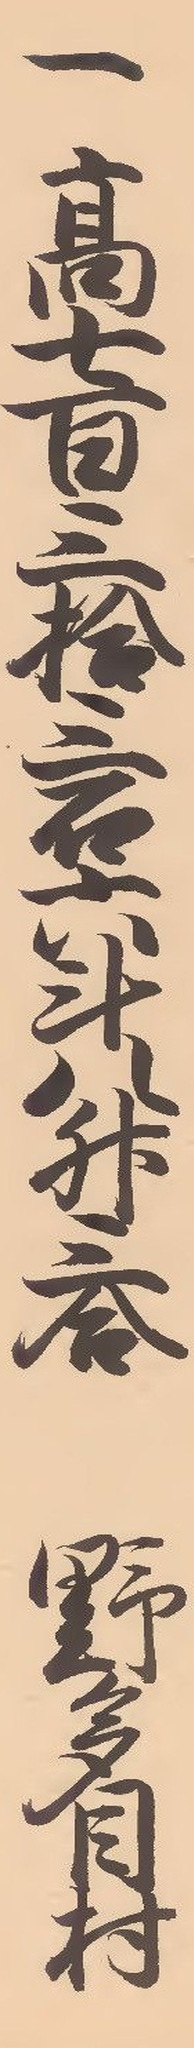一高七百三拾三石六斗八升三合野多目村
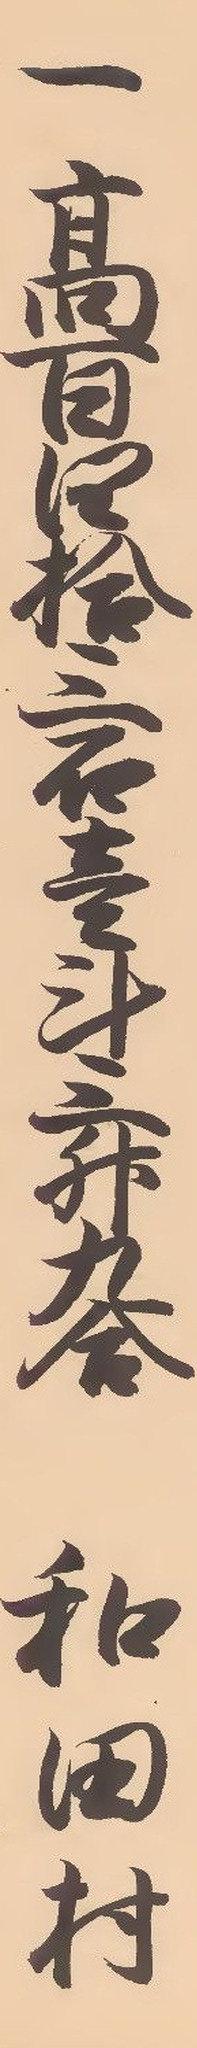一高百四拾三石壱斗三升九合和田村

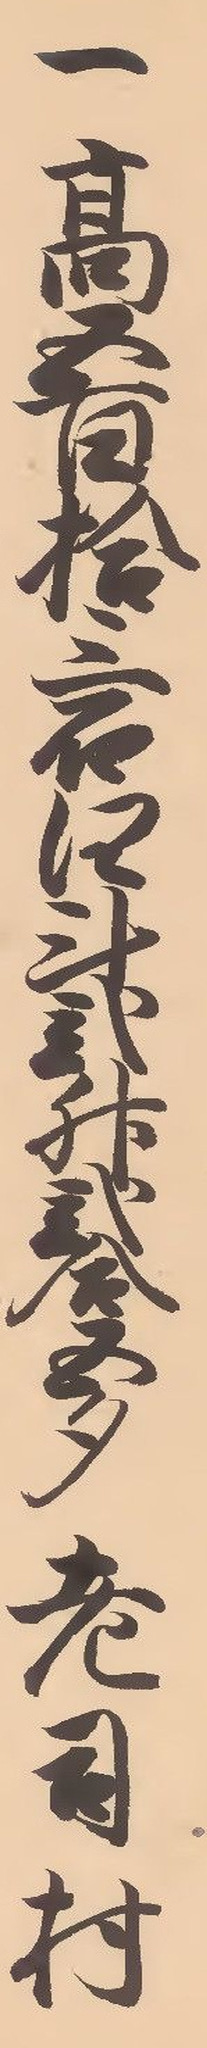一高五百拾三石四斗弐升弐合五勺老司村
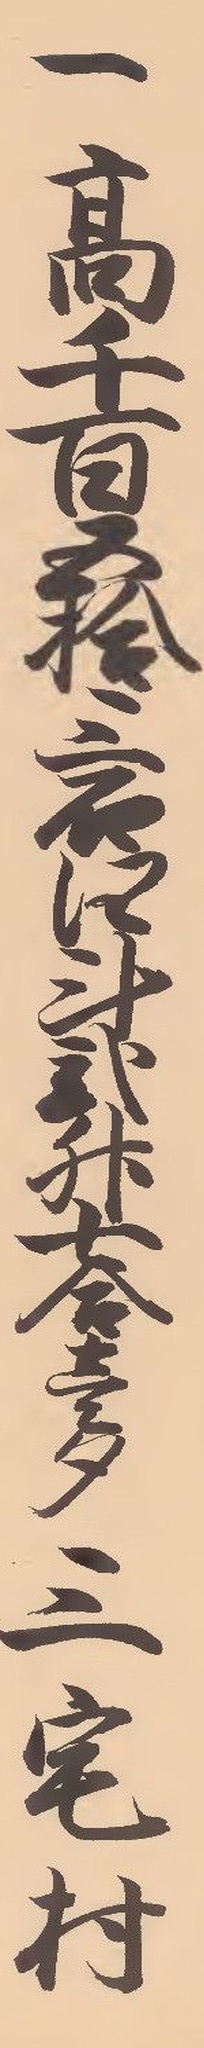一高千百五拾三石四斗弐升七合壱勺三宅村
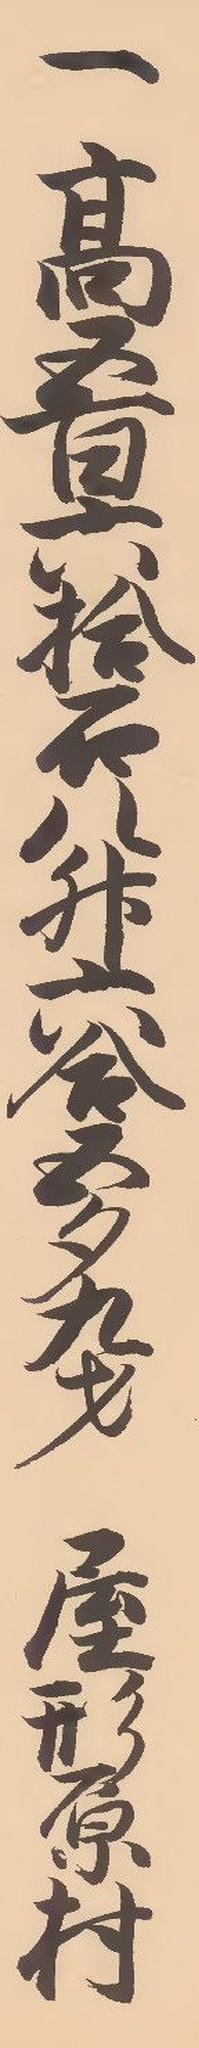一高五百六拾石八升六合五勺九才屋形原村
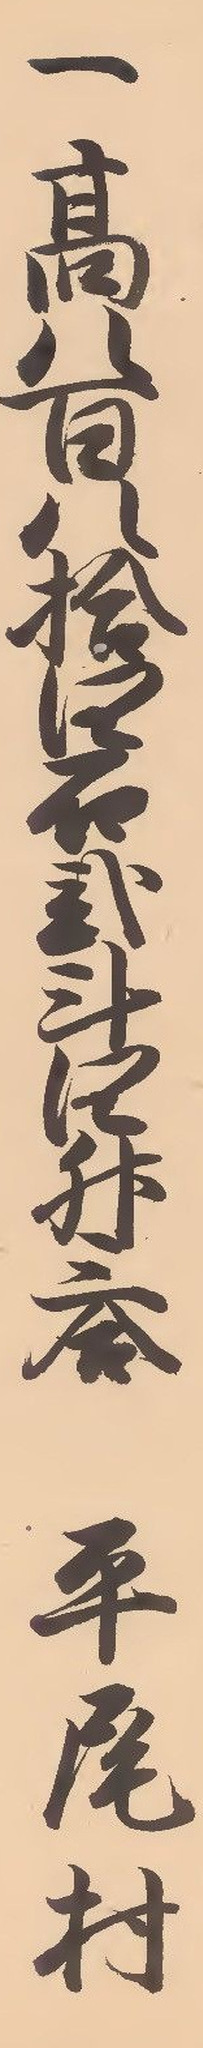一高八百八拾四石弐斗四升三合平尾村
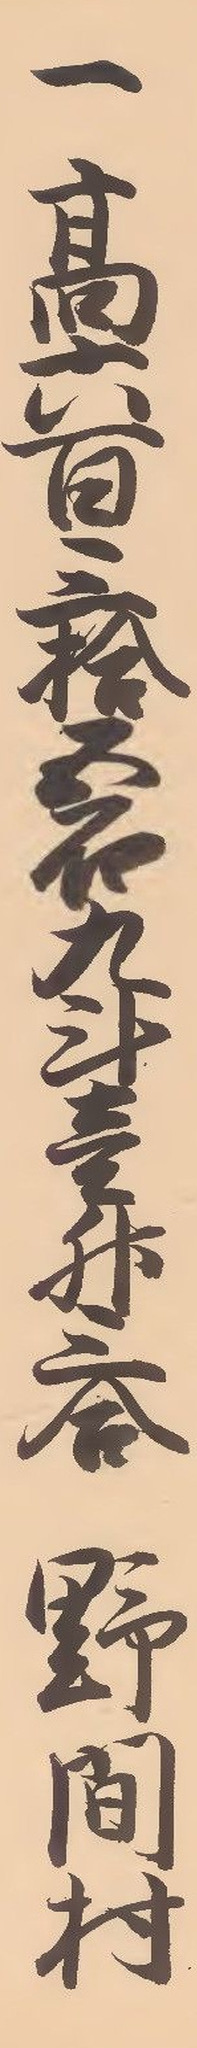一高六百三拾五石九斗壱升三合野間村
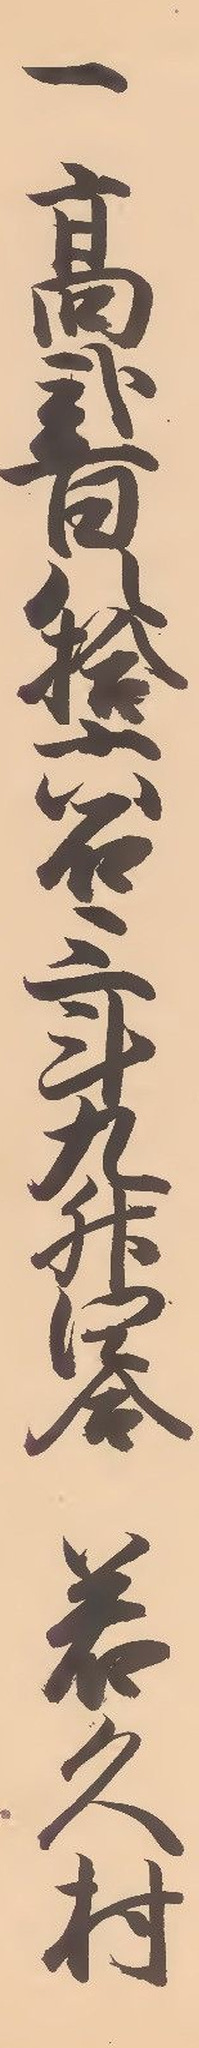一高弐百八拾六石三斗九升四合若久村

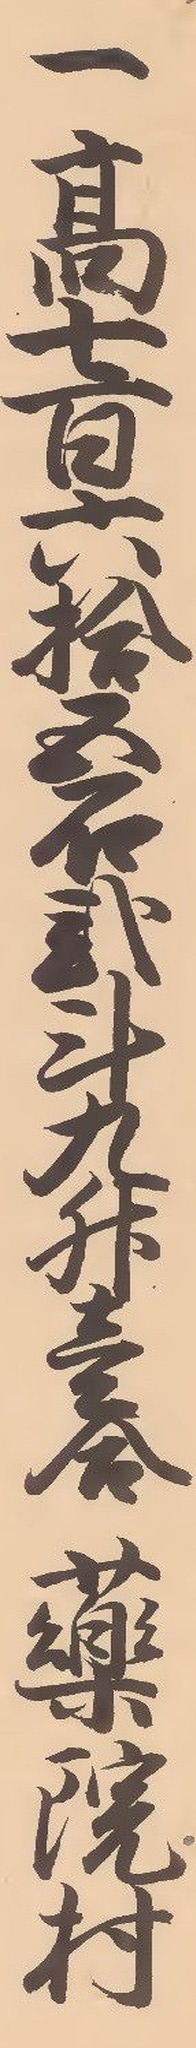一高七百六拾五石弐斗九升壱合薬院村
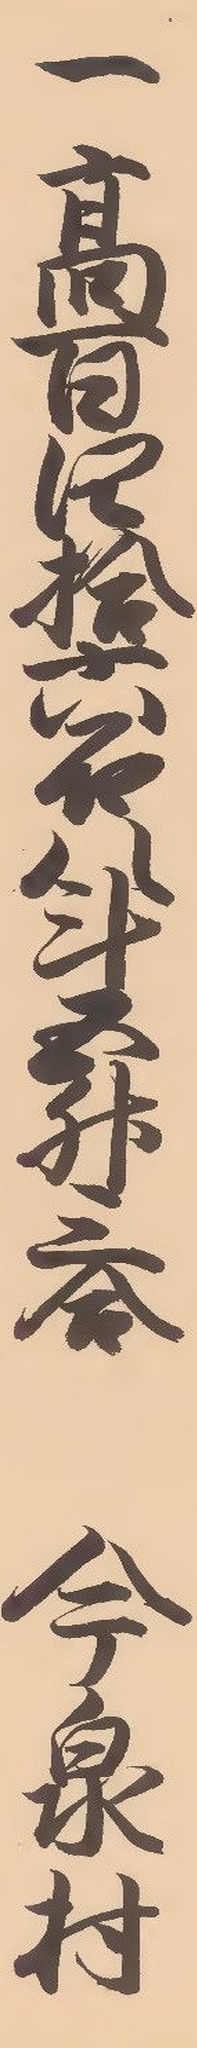一高百四拾六石八斗五升三合今泉村
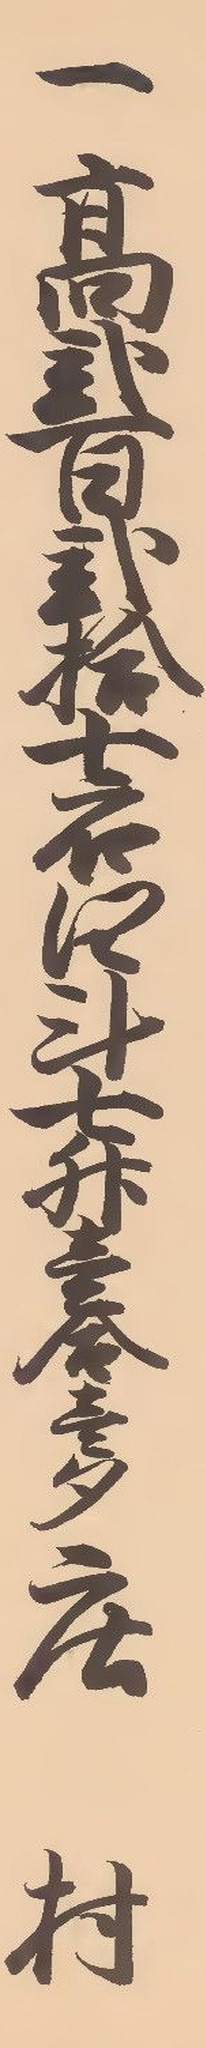一高弐百弐拾七右四斗七升壱合壱勺庄村
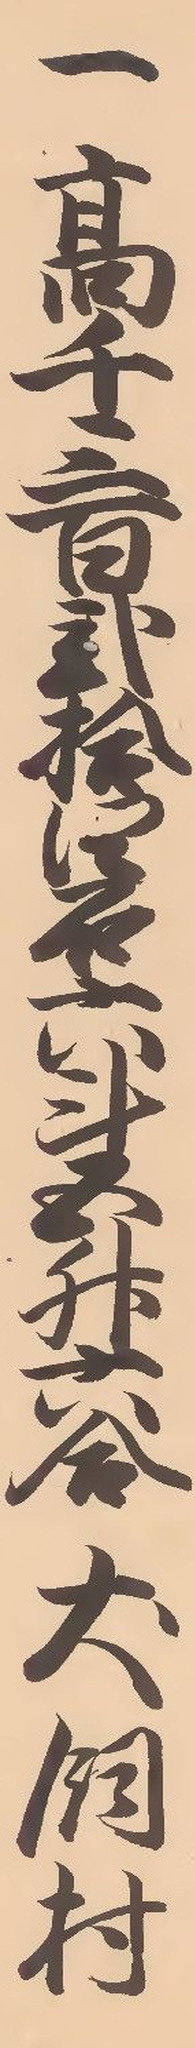一高千三百弐拾四石六斗五升六合犬飼村
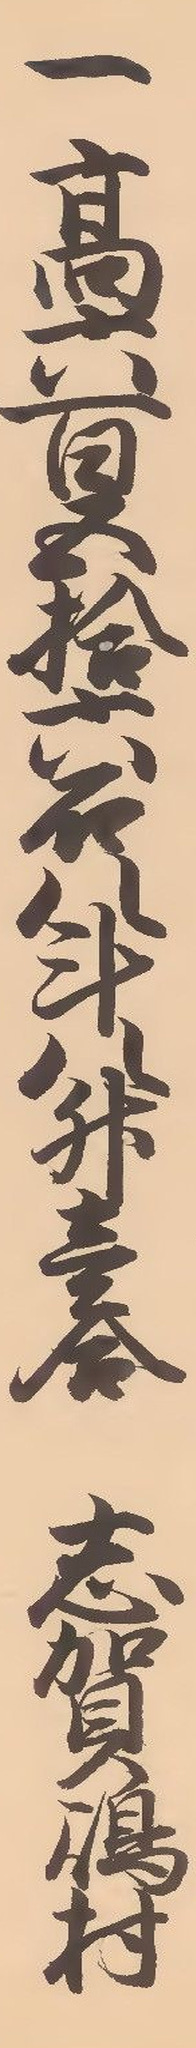一高六百五拾六石八斗八升壱合志賀島村
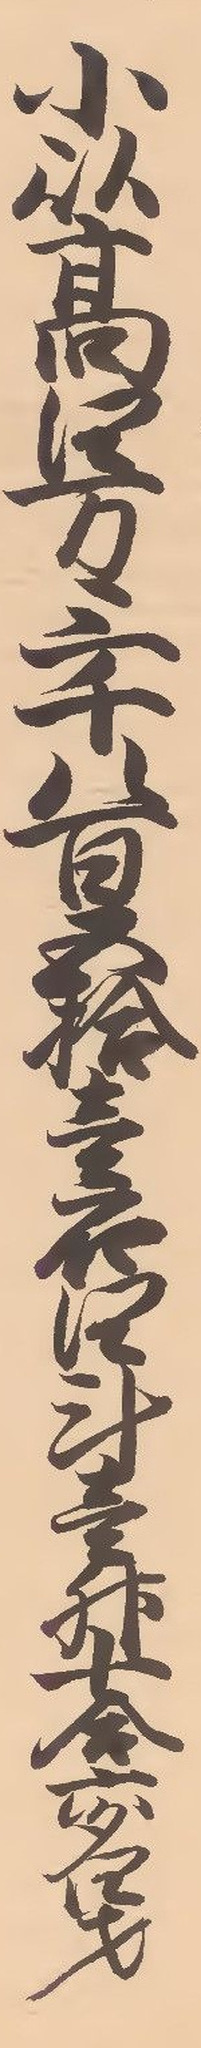小以高四万三千八百五拾壱石四斗壱升七合六勺四才
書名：筑前国郷帳
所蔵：国立公文書館 National Archives of Japan
